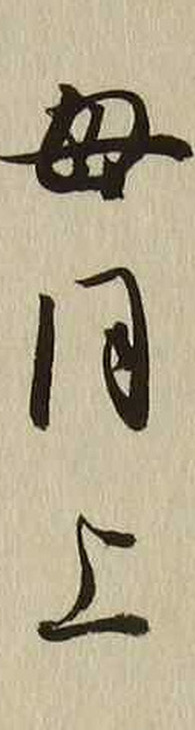母同上
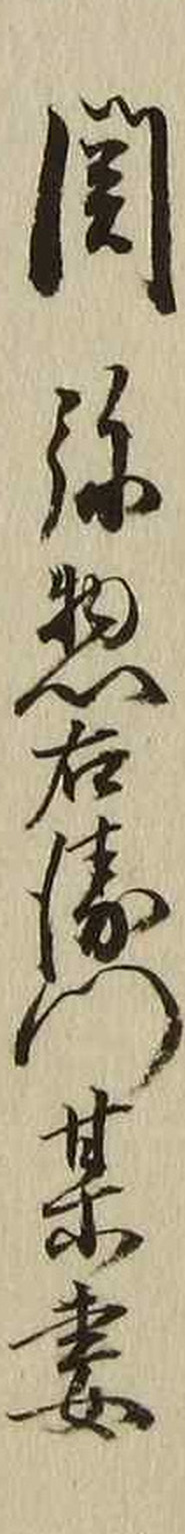関弥惣右衛門某妻
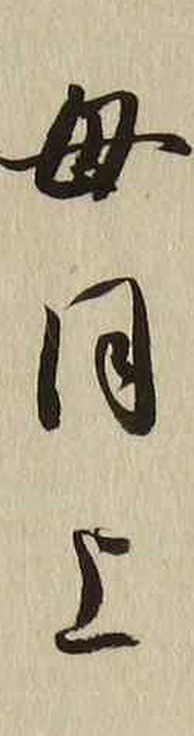母同上
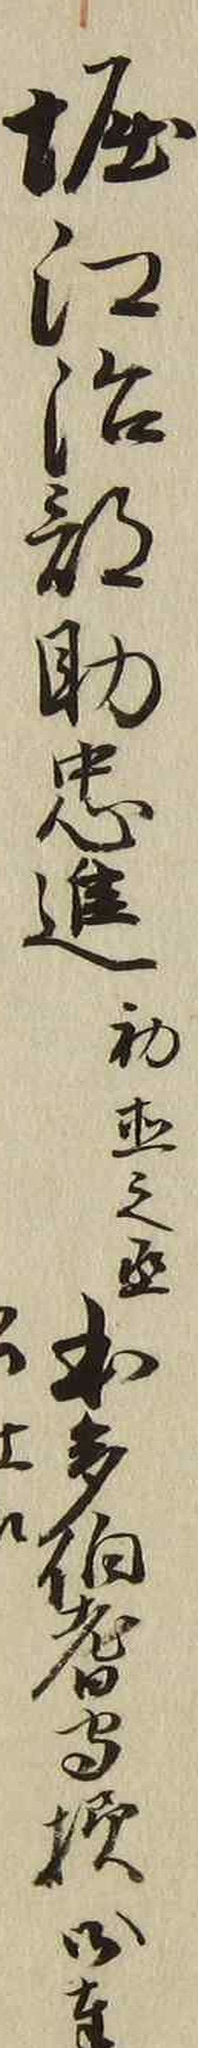堀江治部助忠進初直之丞本多伯耆守様御奉
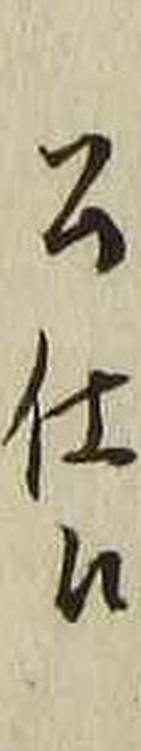公仕候
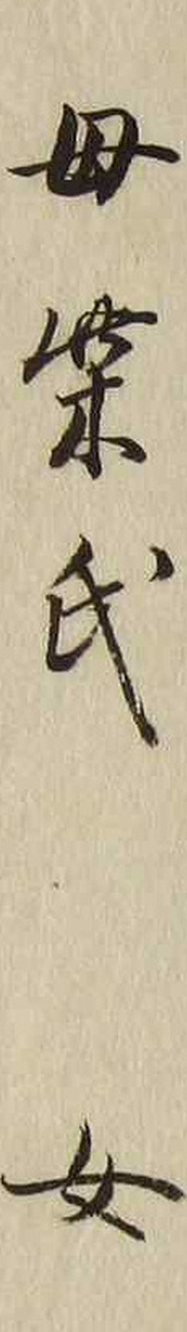母柴氏女
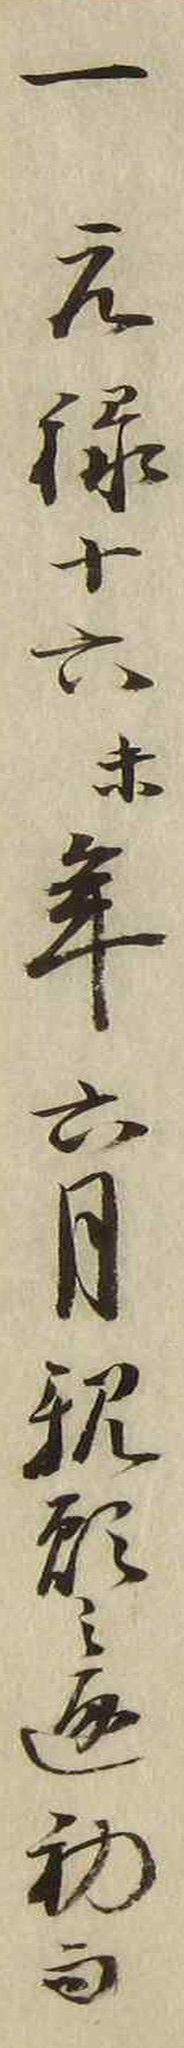一元禄十六未年六月親願之通初而

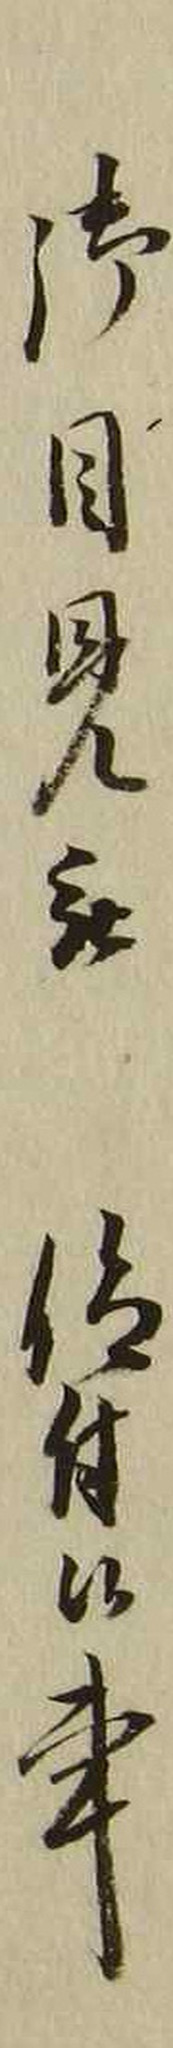之御目見被仰付候事
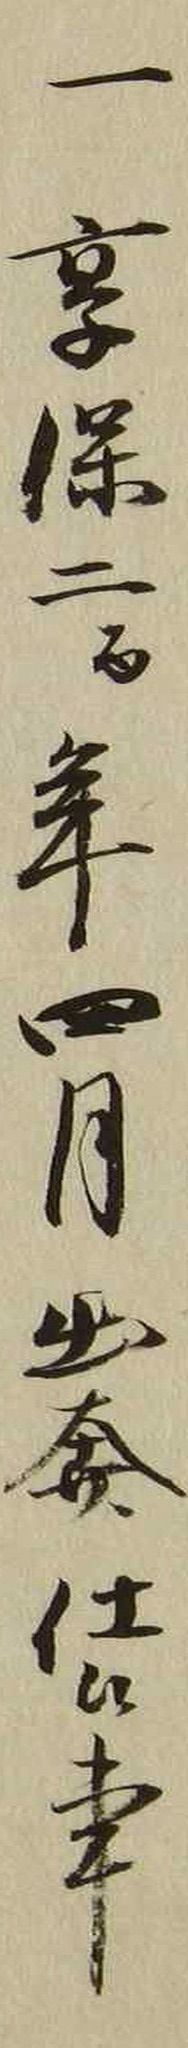一享保二酉年四月出奔仕候事
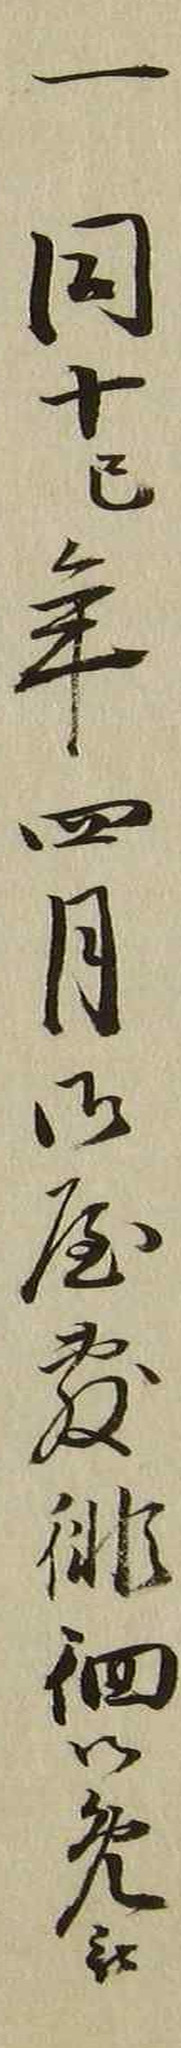一同十巳年四月御屋敷徘徊御免被
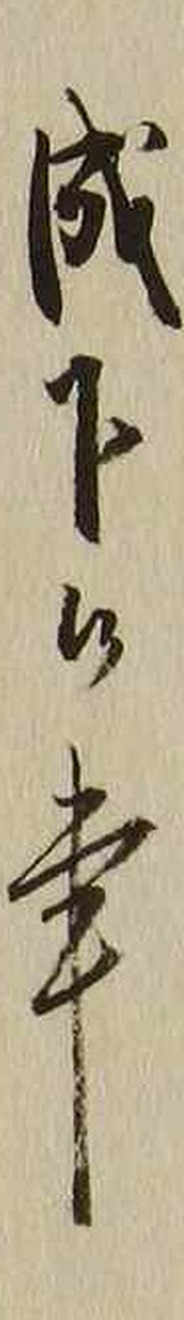成下候事
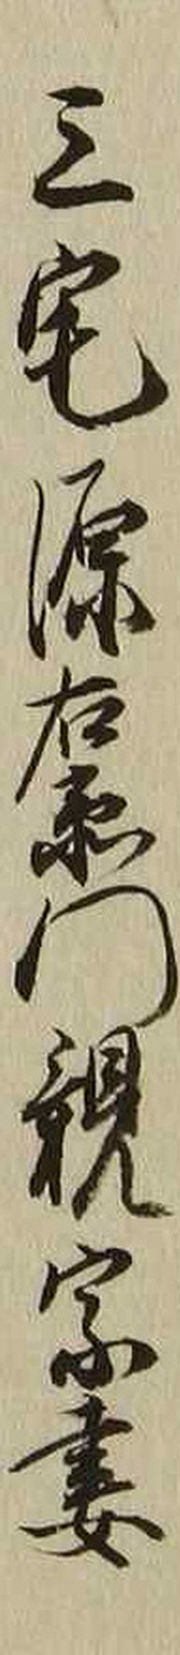三宅源右衛門親家妻
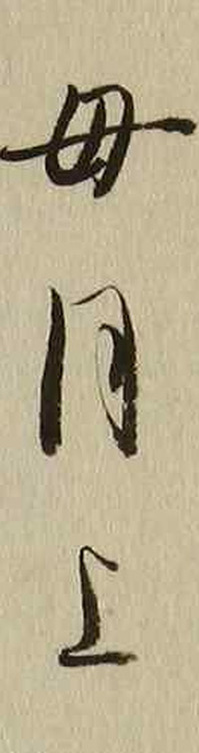母同上
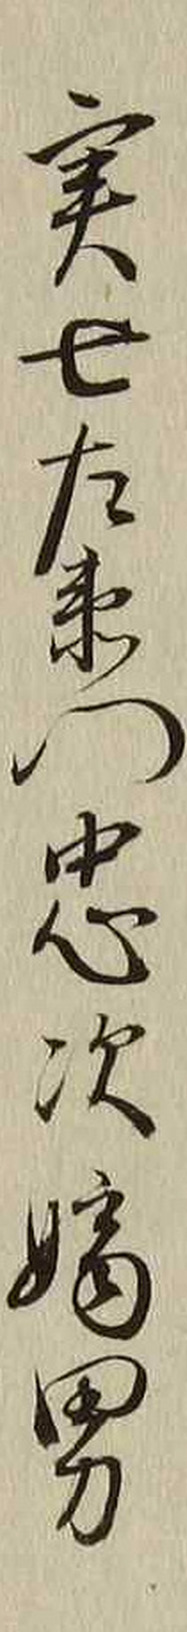実七左衛門忠次嫡男
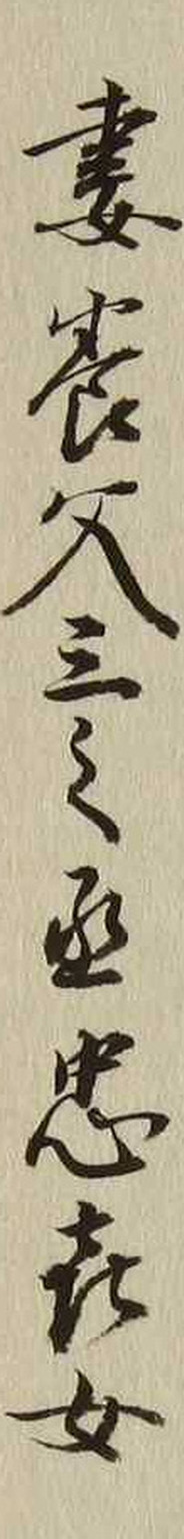妻養父三之丞忠㐂女
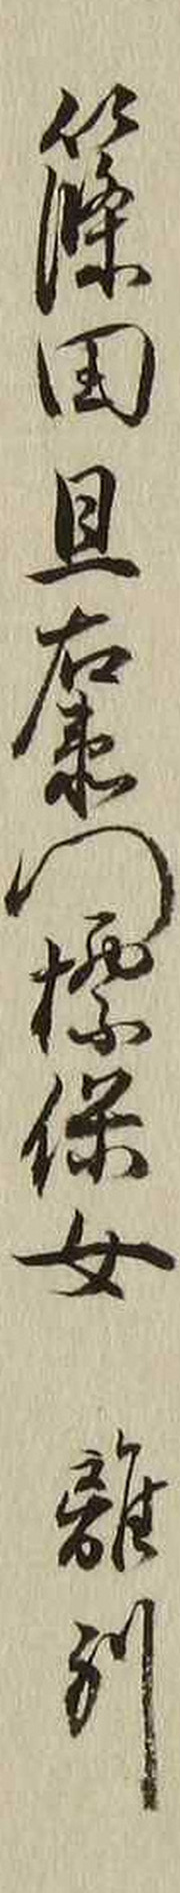篠田且右衛門標保女離別
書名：諸士系譜　巻之69　を之部3
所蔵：会津若松市立会津図書館
